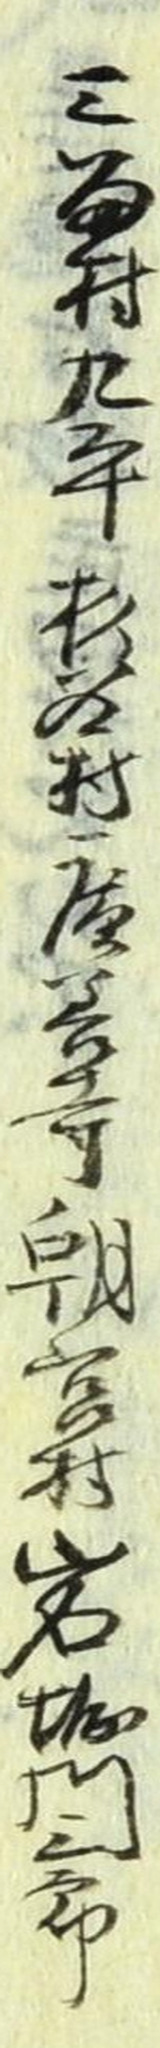三留村九平杉谷村広善寺朝宮村岩堀門三郎
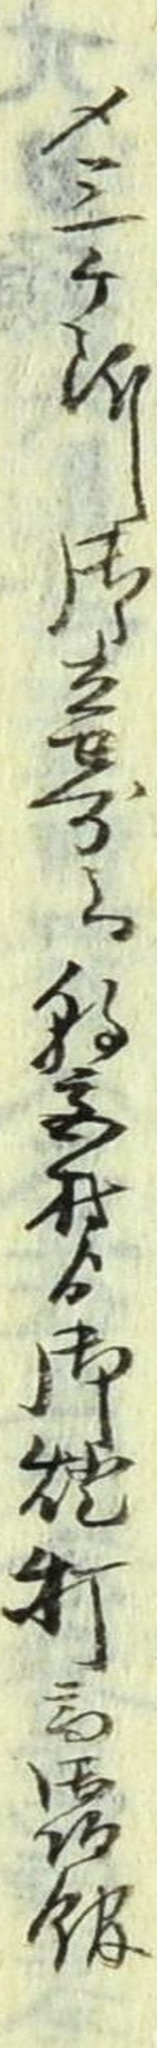〆三ヶ所御立寄ニ而朝宮村ゟ御燈灯ニ而御帰館
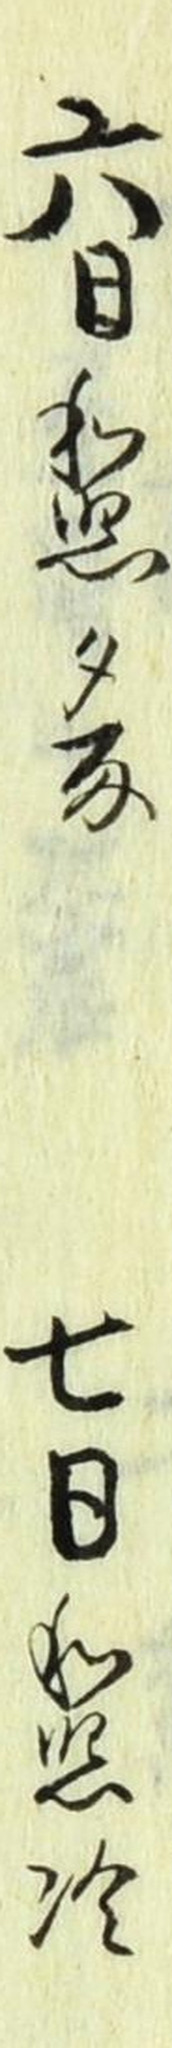六日和照夕雨七日和照冷
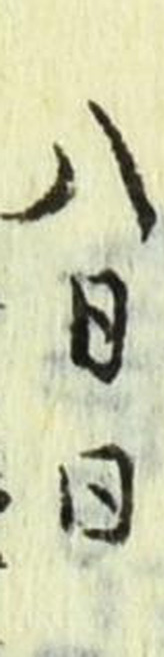八日同
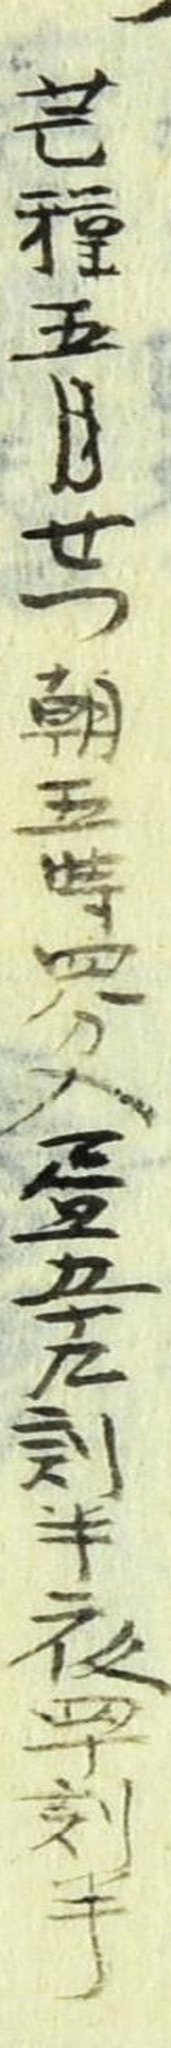芒種五月せつ朝五時四分入昼五十九刻半夜四十刻半
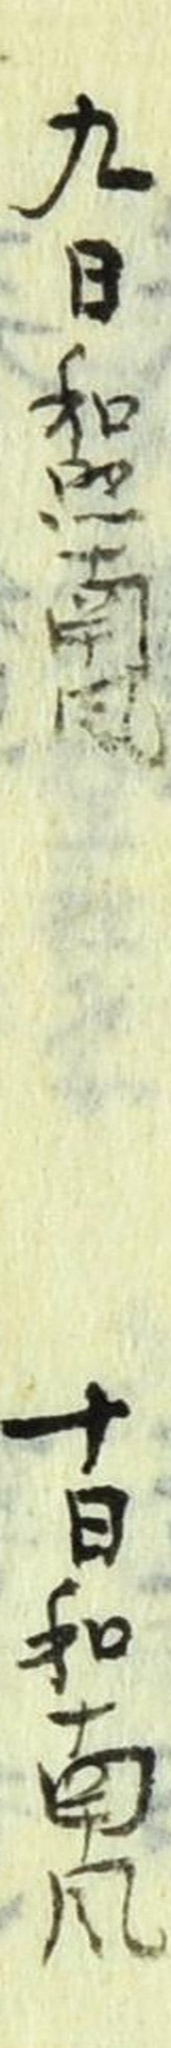九日和照南風十日和南風
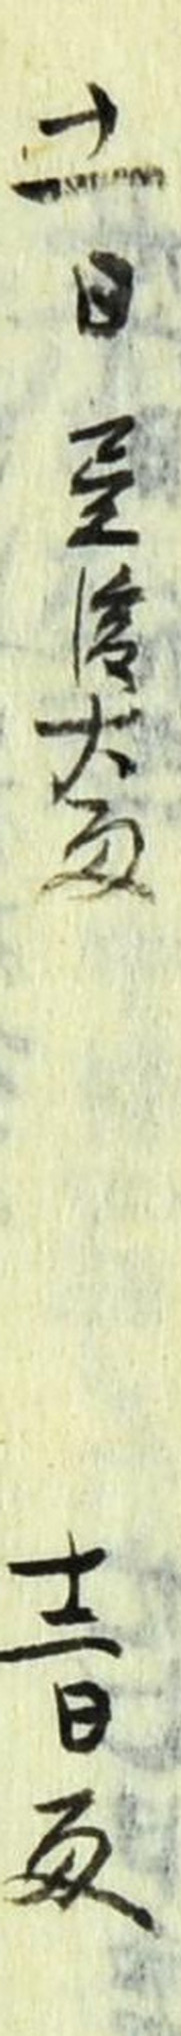十一日昼後大雨十二日雨
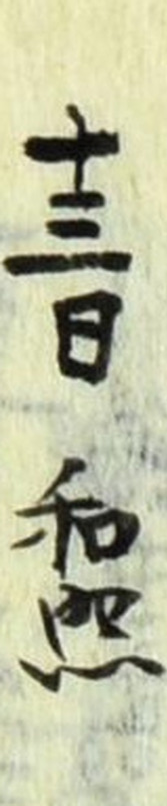十三日和照
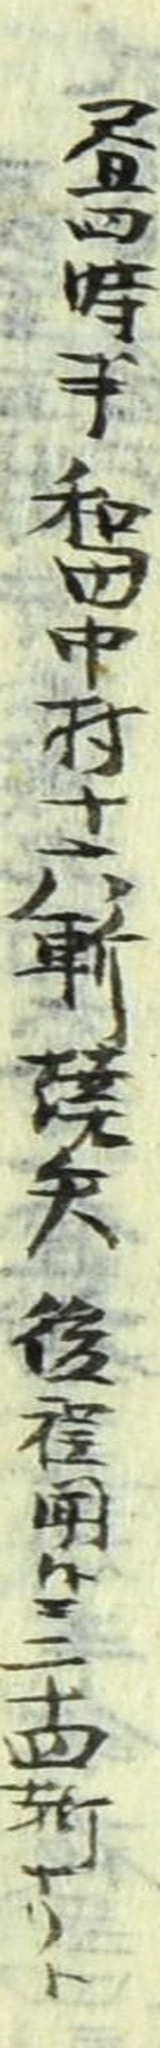昼四時半和田中村十六軒焼失後程聞候ニ二十四軒ナリト
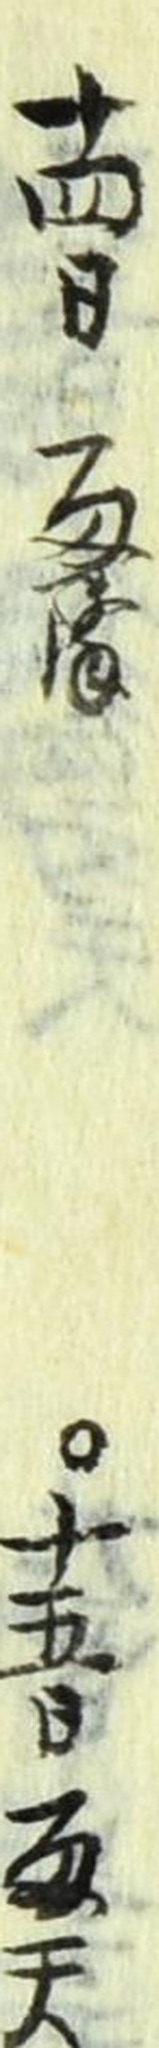十四日雨降○十五日雨天
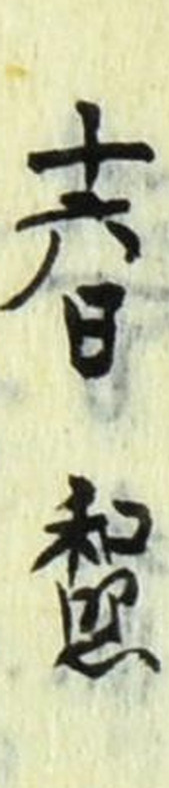十三日和照
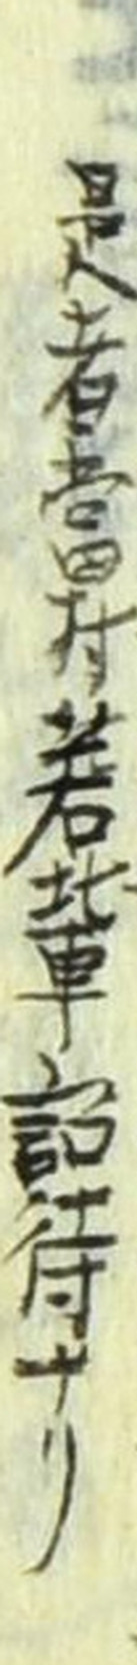是者当村若輩詔待ナリ
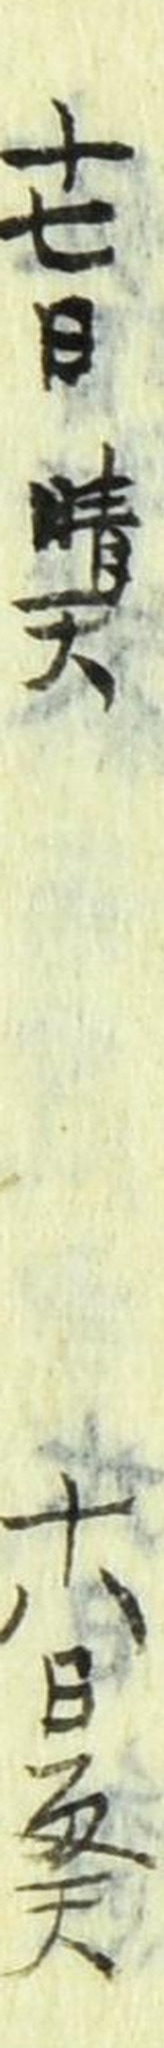十七日晴天十八日雨天

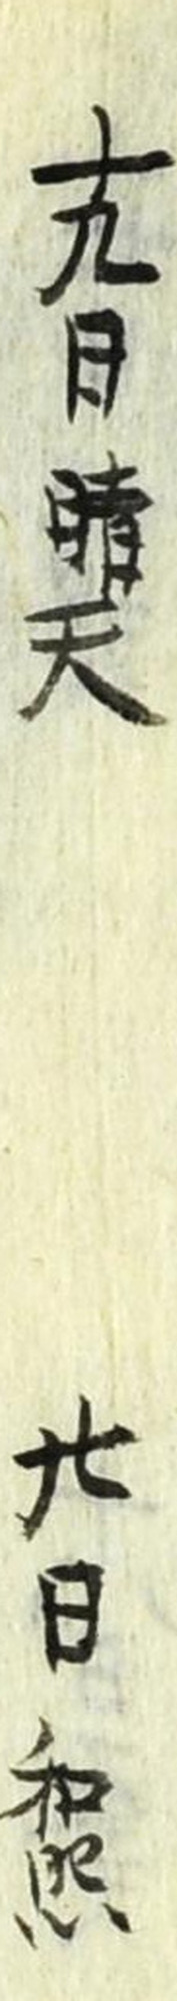十九日晴天廿日和照
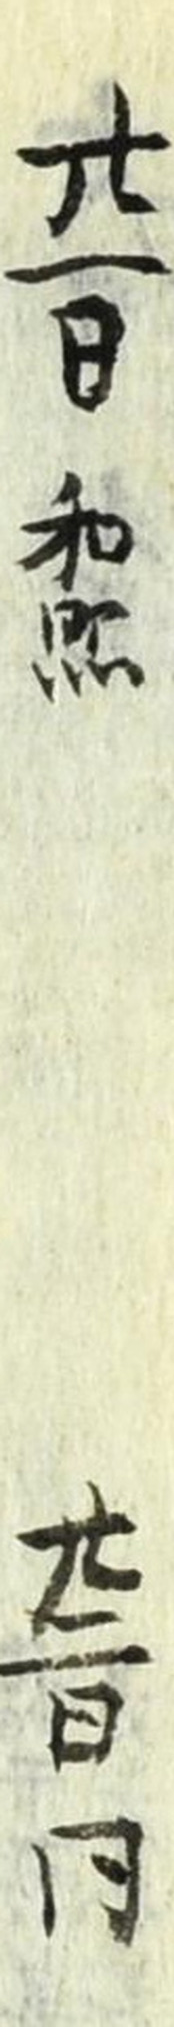廿一日和照廿二日同
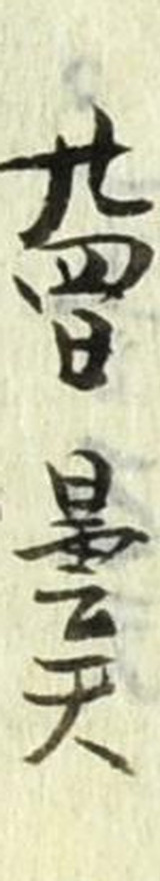廿五日雨天
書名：（日記）
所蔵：福井県文書館 Fukui Prefectural Archives
